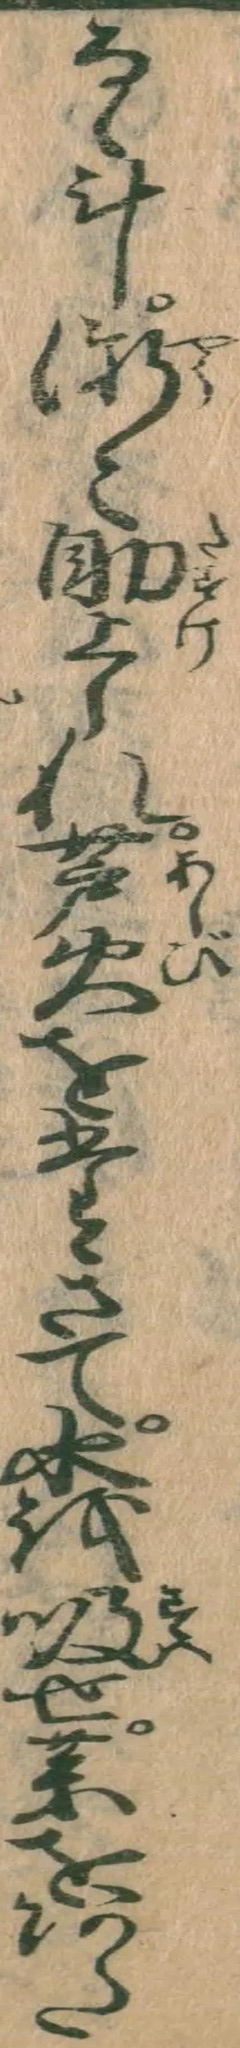るゝ計。漸々助上られ。芦火をたきて。水を吸せ。薬をあた
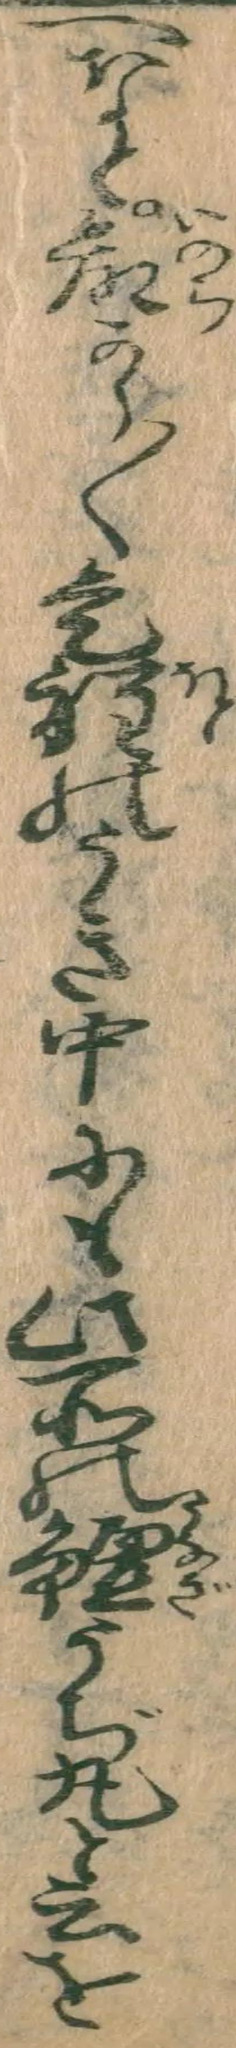へなと。命から〳〵是程のうき中にも此所の鱣うぢ丸と云を
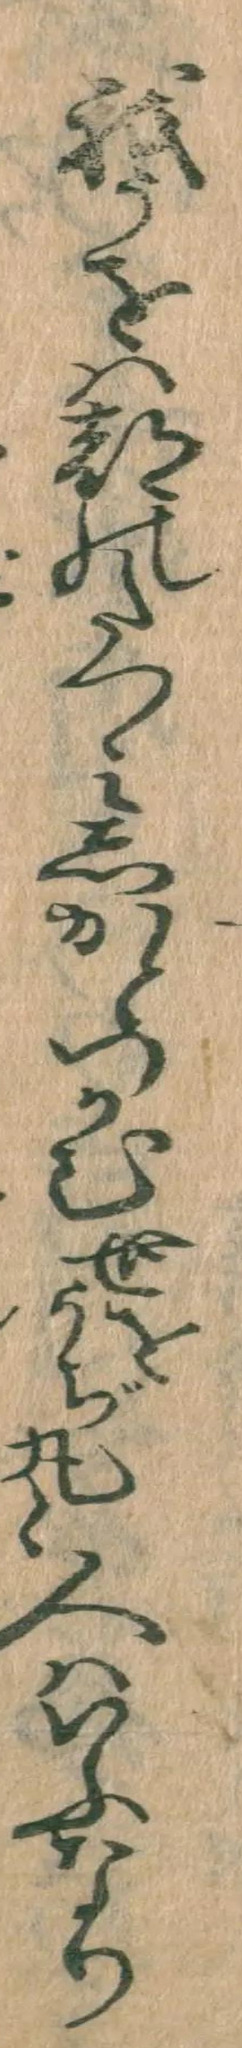我うをは都のたつみしかとつかむ世をうぢ丸と人はいふなり
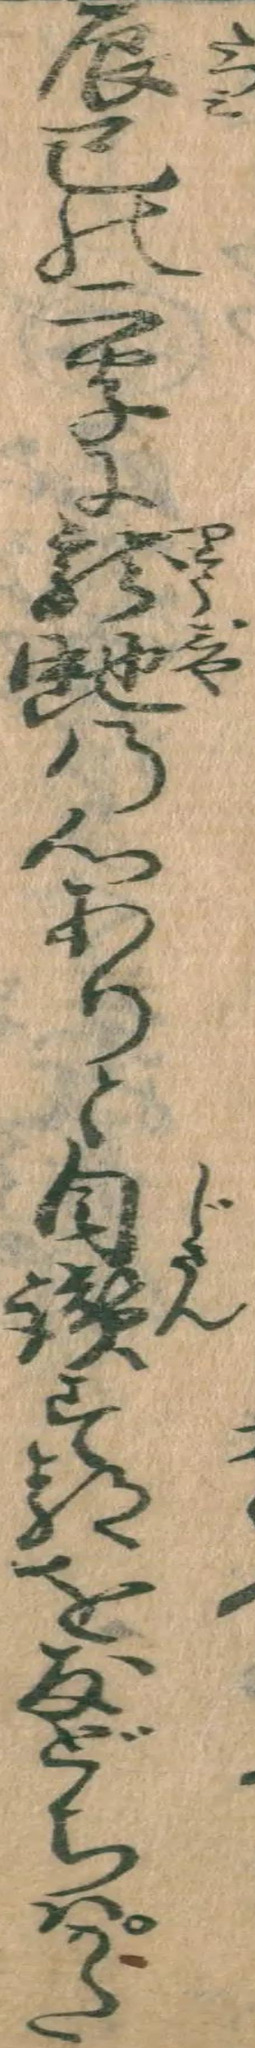辰巳の二字に竜蛇の心ありと自讃するを友どちは。かた
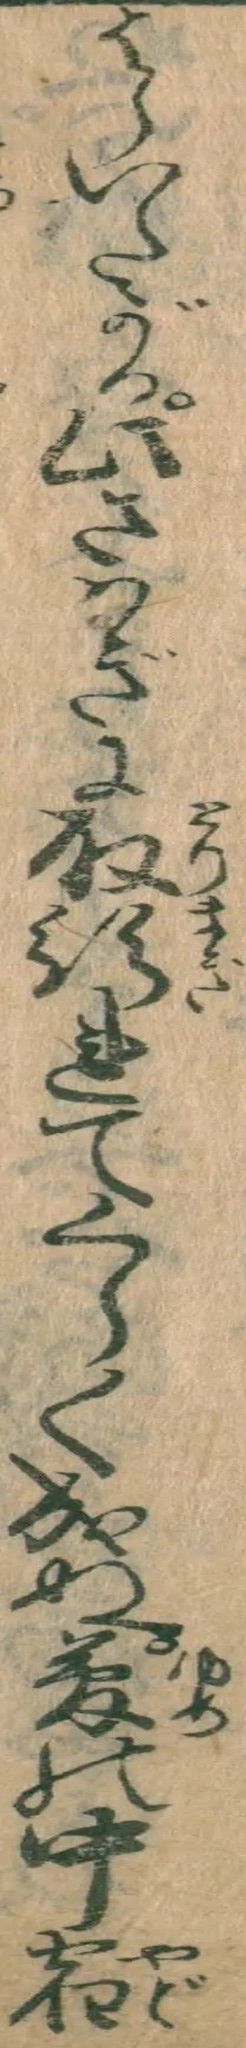はらいたがる。此さはぎに取紛れてくら〱成ぬ。夢の中宿
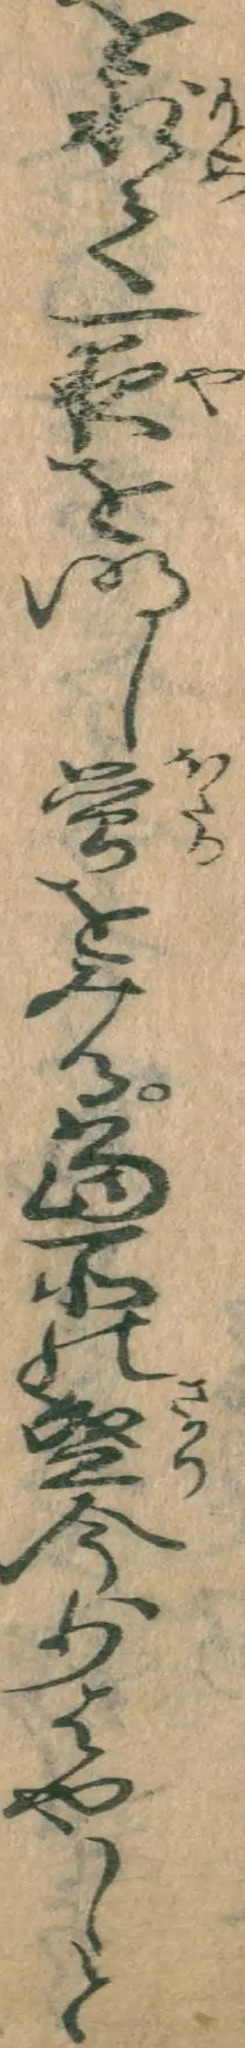を求て一夜を明し蛍をみる。当所の盛今少はやしと
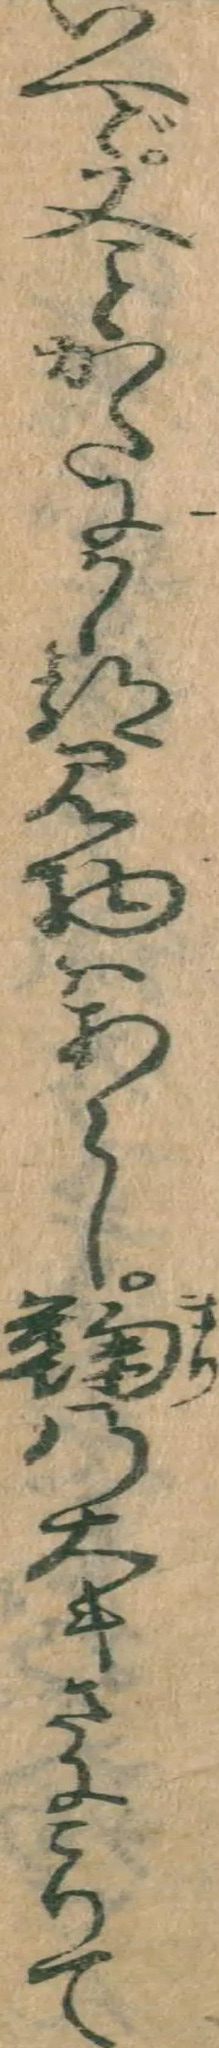いへど。又ことかたにかゝる見物はあらし。鞠の大きさにこりて

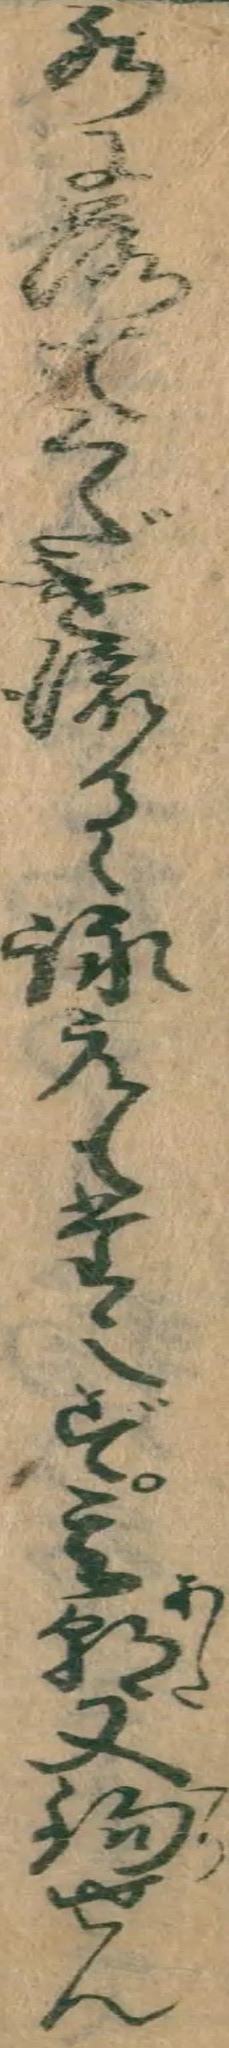水に落てくだけ流るゝ詠えもたえず。其朝又釣せん
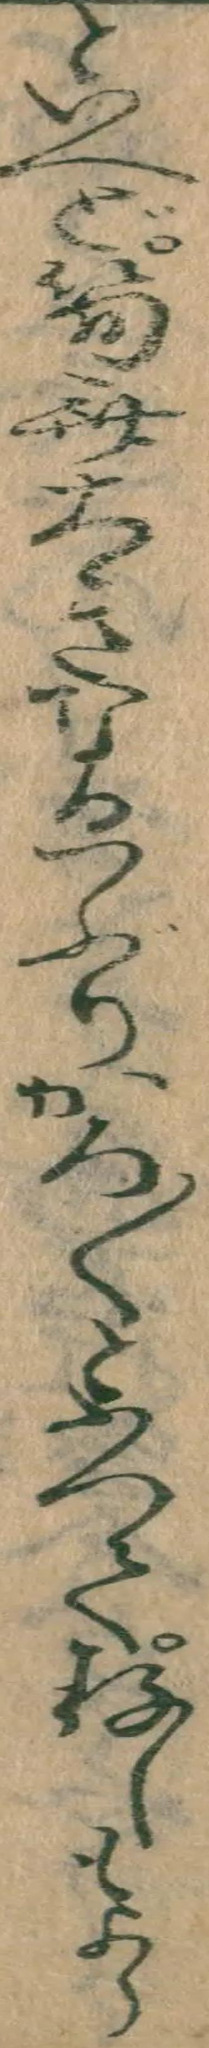といへど。筍斎大きなるつぶりかろ〳〵とふつて。存しもよら
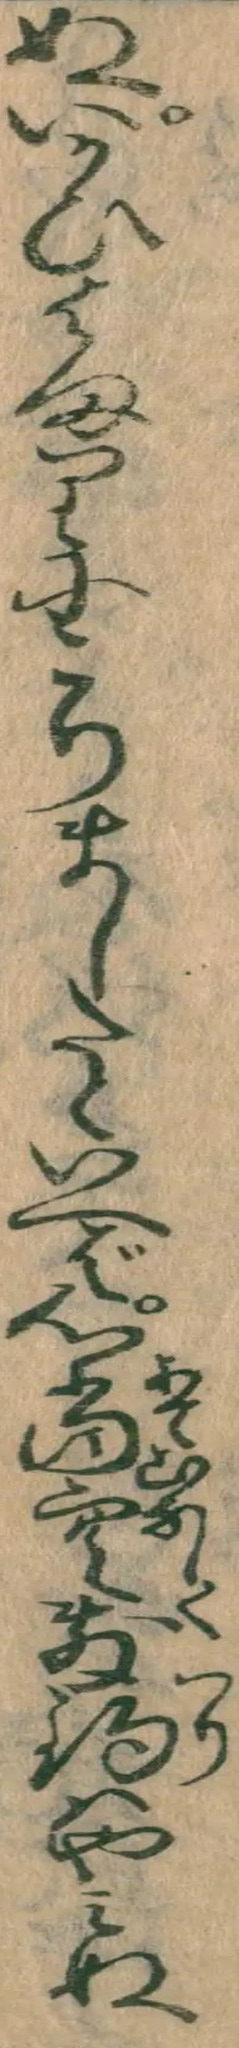ぬ。いかひはまりにこりましたといへば。心当空敷釣はやみぬ
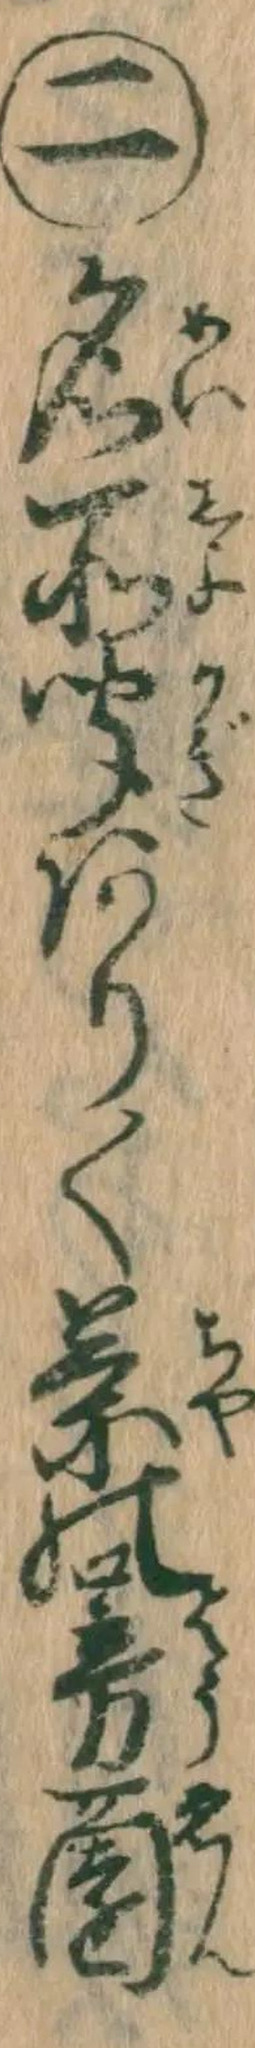二名所聞ありく茶の芳園
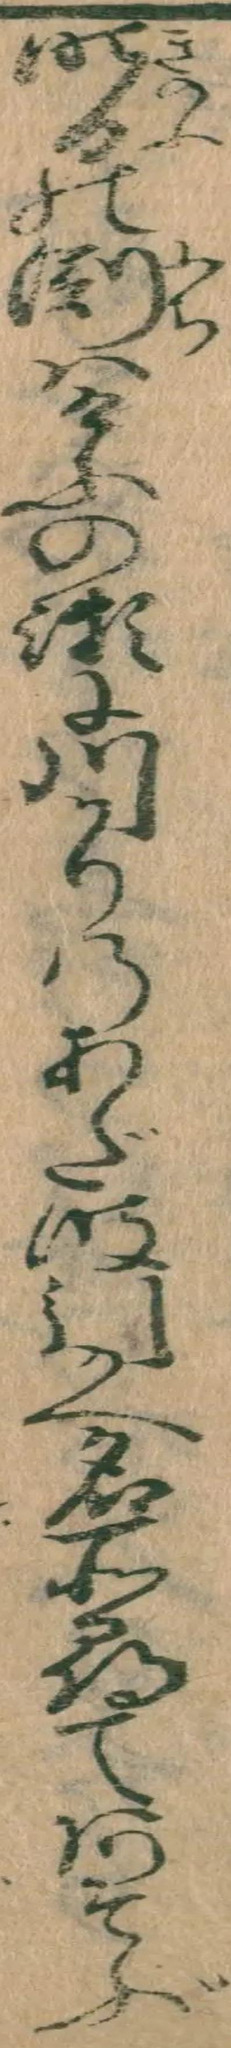昨日の淵はけふの瀬に川かりのあだ波引かへ名所尋てあそぶ
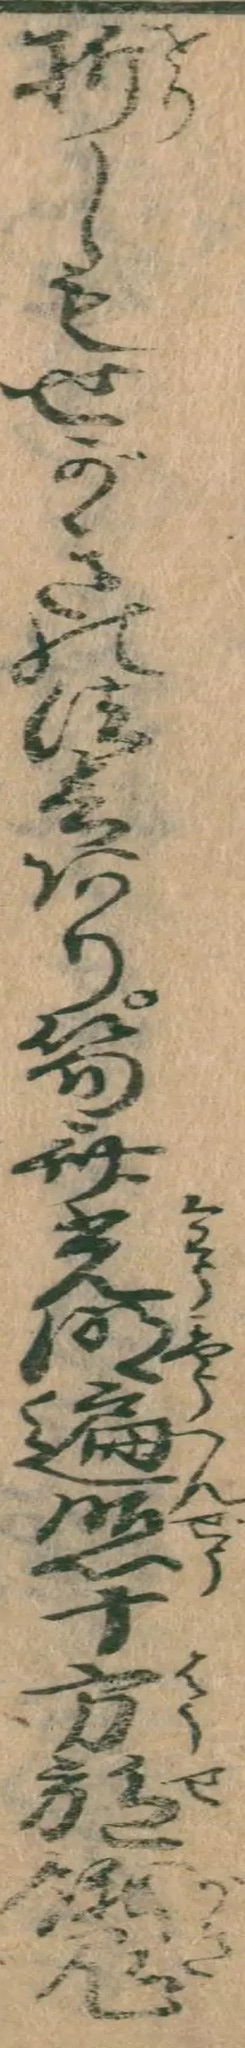折しもせがきの法会あり。筍斎光明遍照十方施餓鬼
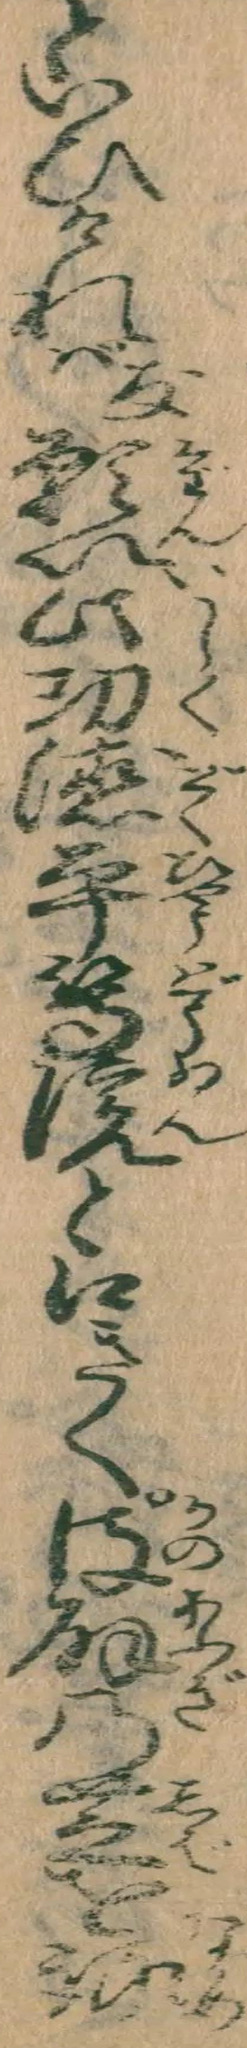といひければ友願以此功徳平等院と口きく。彼扇の芝を詠
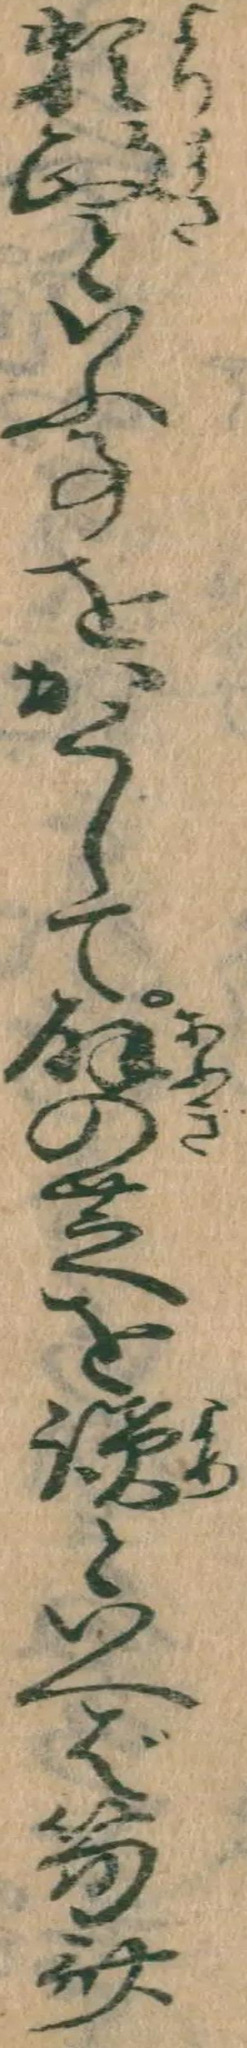頼政といふ事をかくして。扇の芝を読といへば筍斎
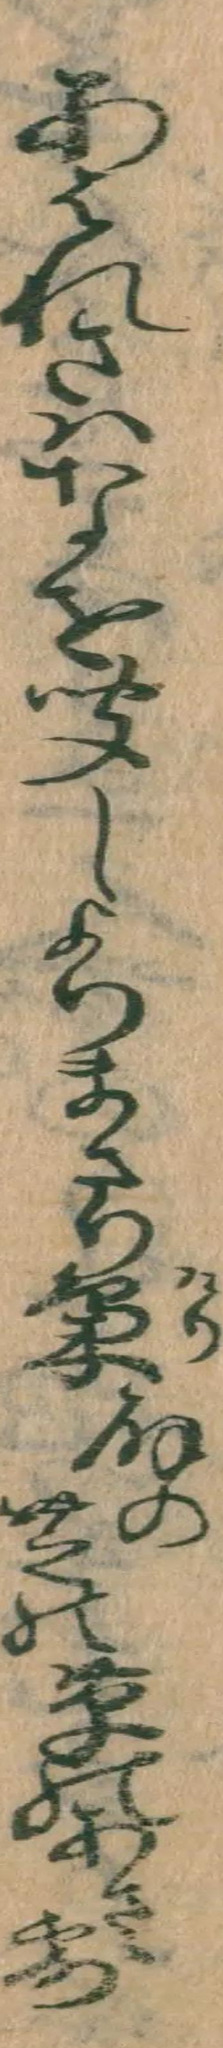あはれさはなを聞しよりまさり鳧扇の芝の草のあさ露
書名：新竹斎 5巻
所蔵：国立国会図書館 National Diet Library, JAPAN
